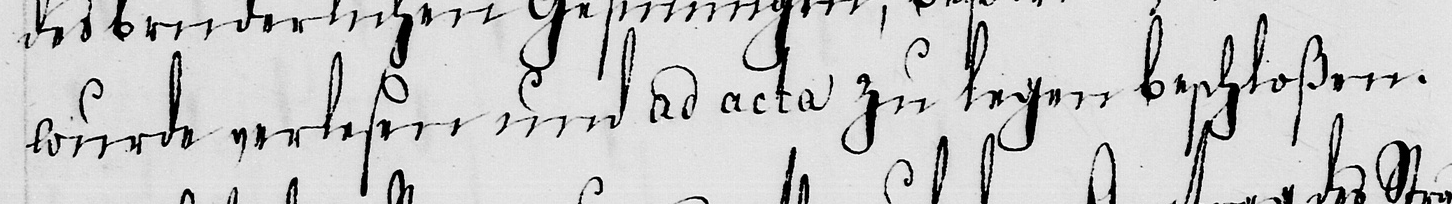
wurde verlesen und ad acta zu legen beschloßen.
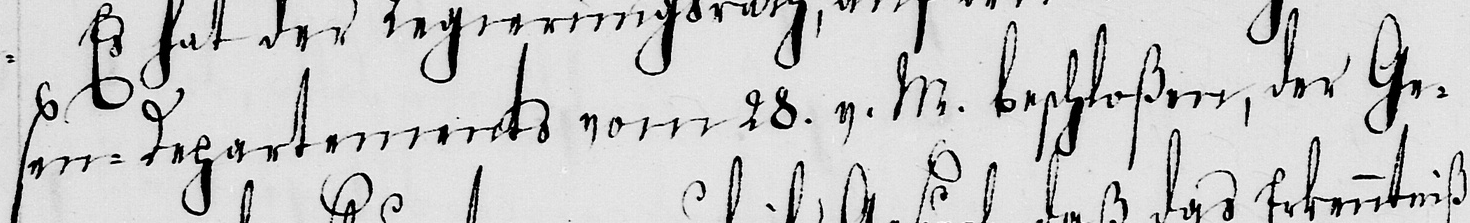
ßen-Departements vom 28. v. M. beschloßen, der Ge¬
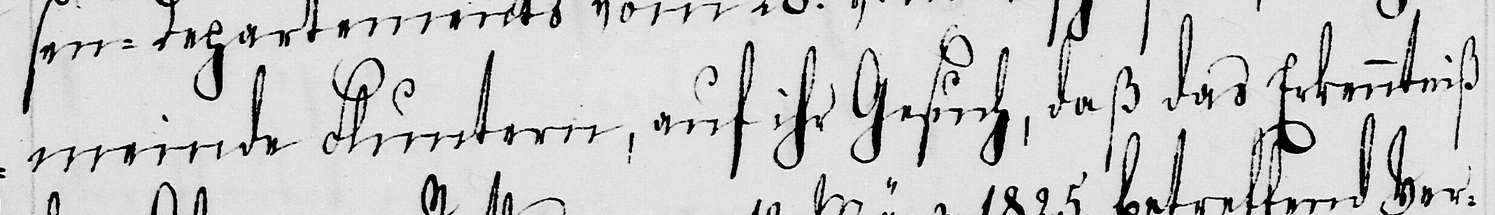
meinde Fluntern, auf ihr Gesuch, daß das Erkenntn¬
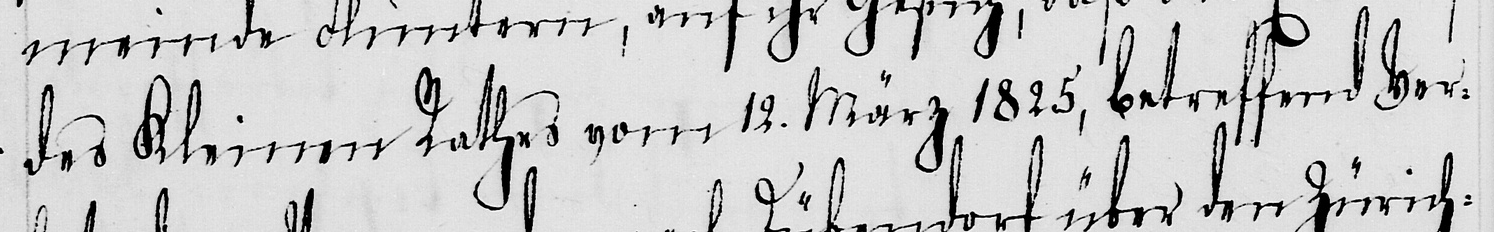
des Kleinen Rathes vom 12. März 1825, betreffend Ver¬
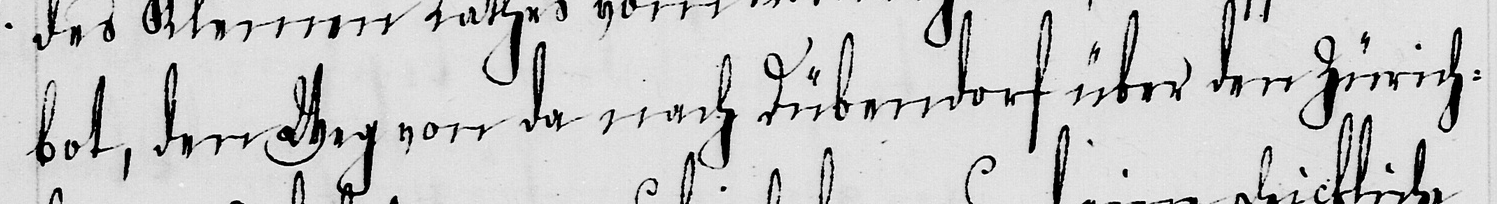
bot, den Weg von da nach Dübendorf über den Zürich¬
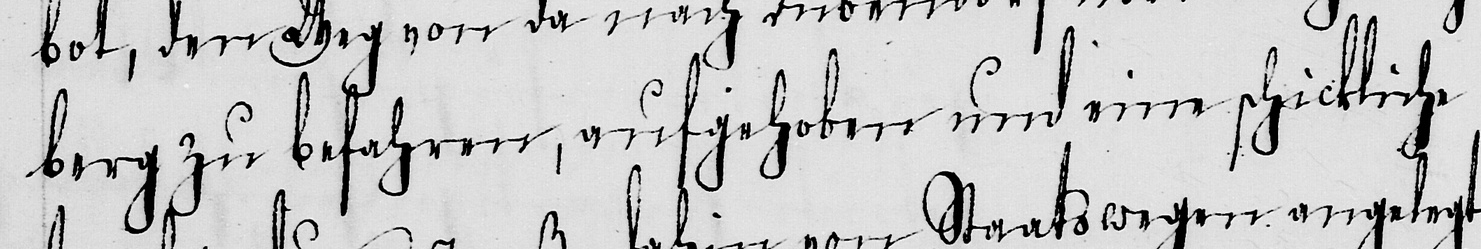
berg zu befahren, aufgehoben und eine schickliche
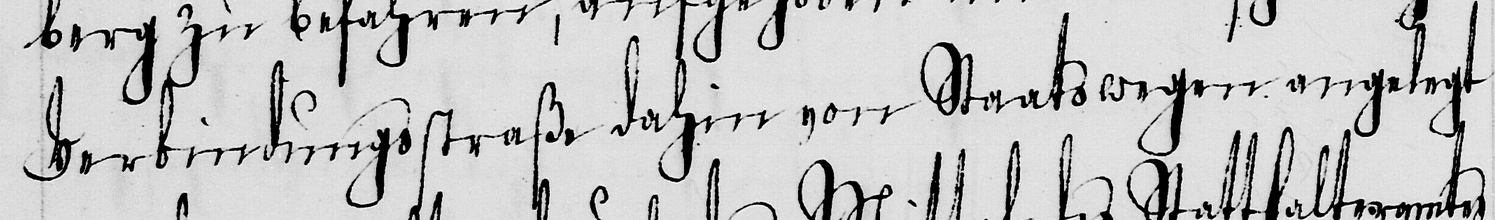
Verbindungsstraße dahin von Staatswegen angelegt
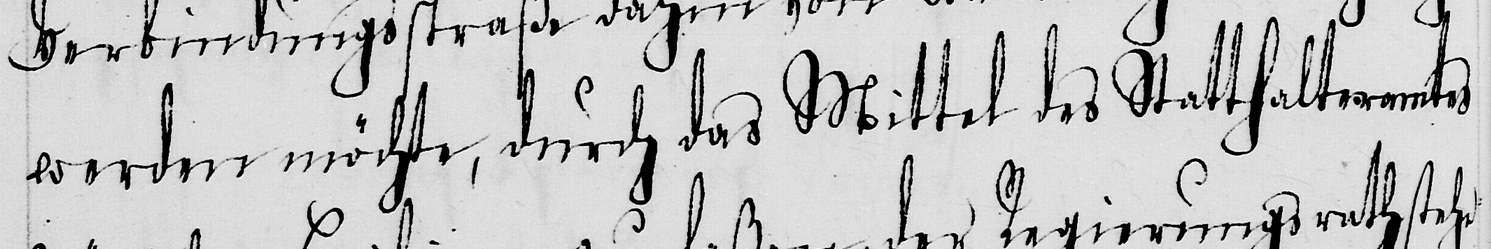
werden möchte, durch das Mittel des Statthalteramt¬
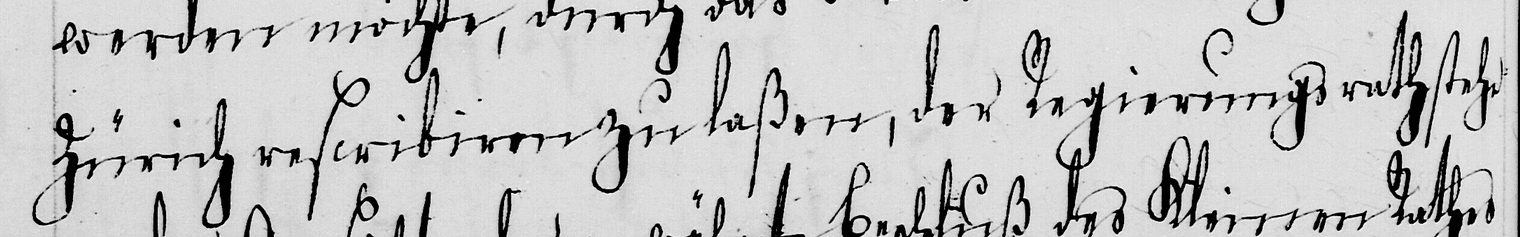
Zürich rescribiren zu laßen, der Regierungsrath ste¬
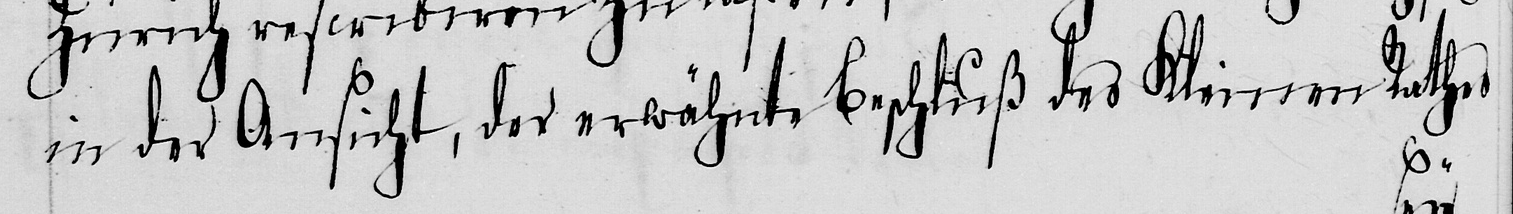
in der Ansicht, der erwähnte Beschluß des Kleinen Rathes
